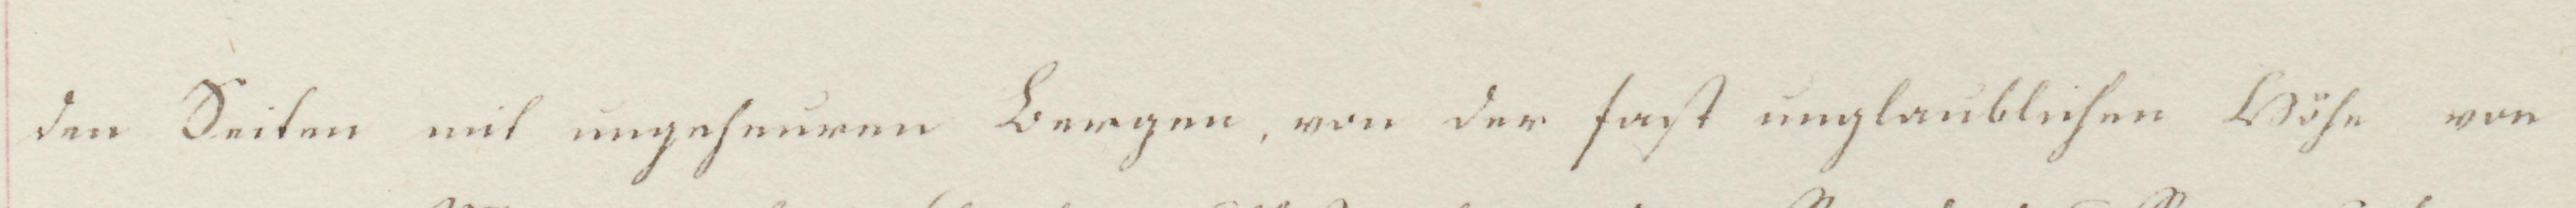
den Seiten mit ungeheuren Bergen, von der fast unglaublichen Höhe von
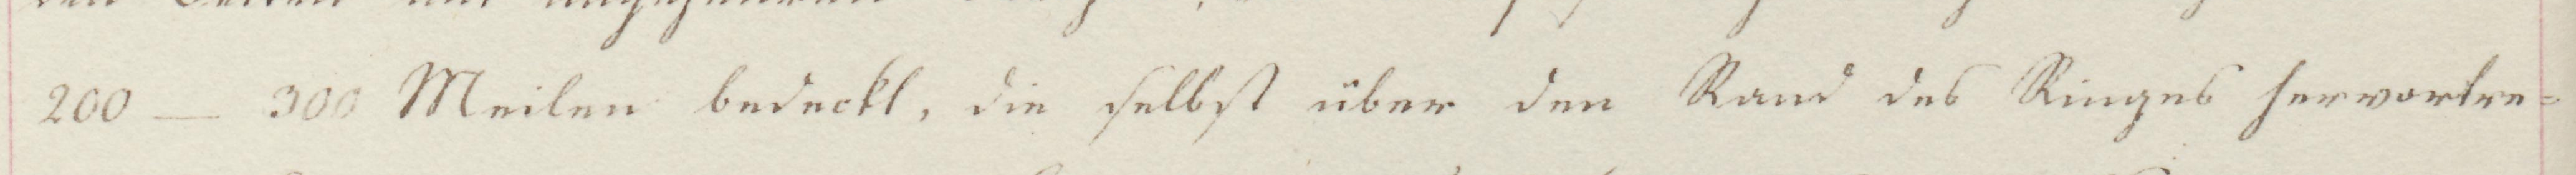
200–300 Meilen bedeckt, die selbst über den Rand des Ringes hervortre-
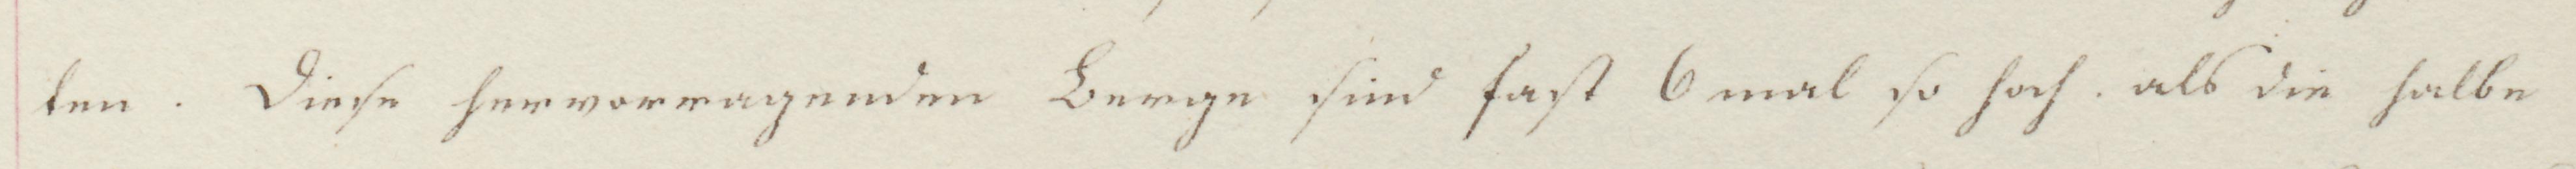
ten. Diese hervorragenden Berge sind fast 6 mal so hoch, als die halbe
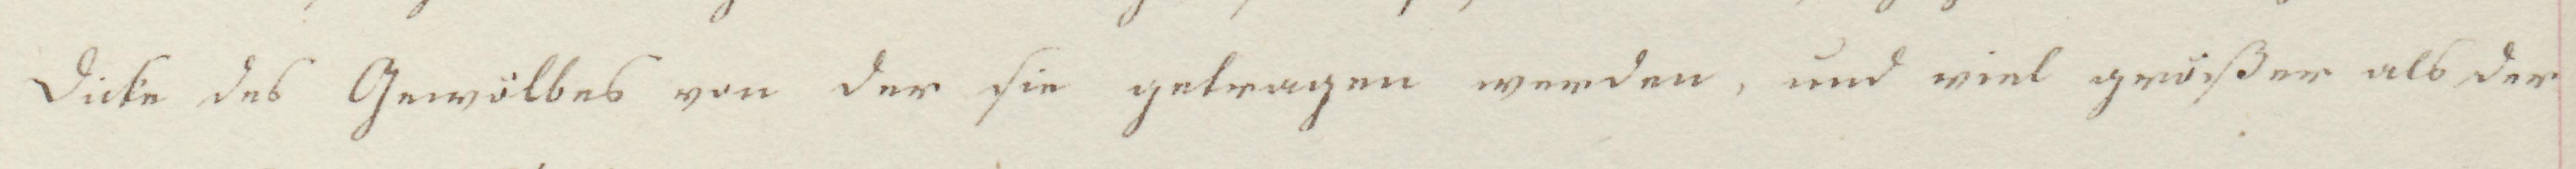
Dicke des Gewölbes von der sie getragen werden, und viel größer als der
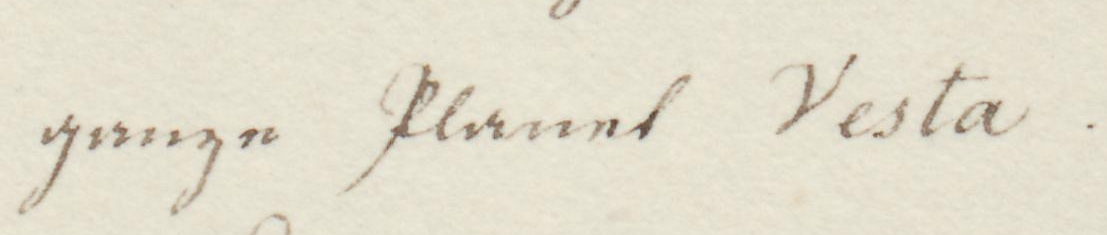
ganze Planet Vesta.
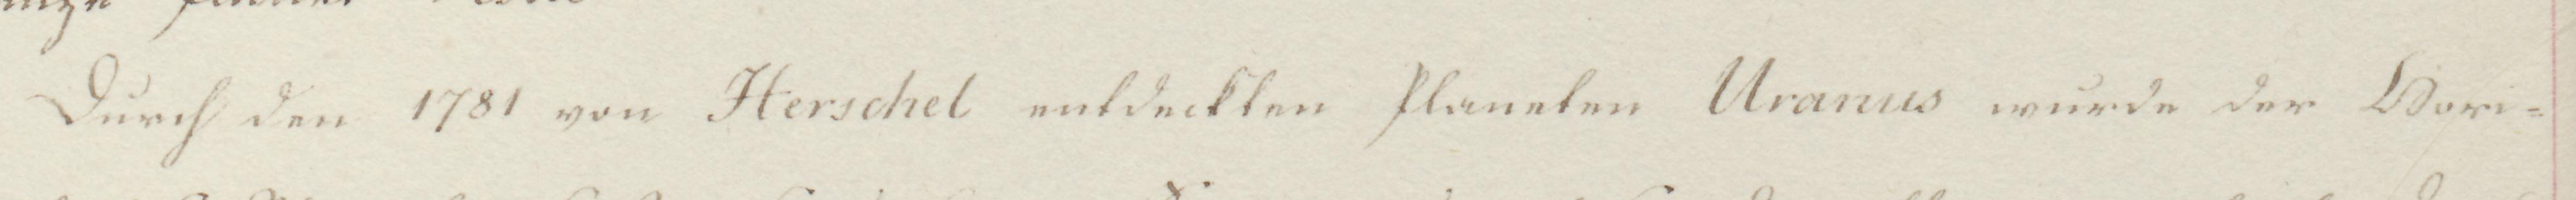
Durch den 1781 von Herschel entdeckten Planeten Uranus wurde der Hori-
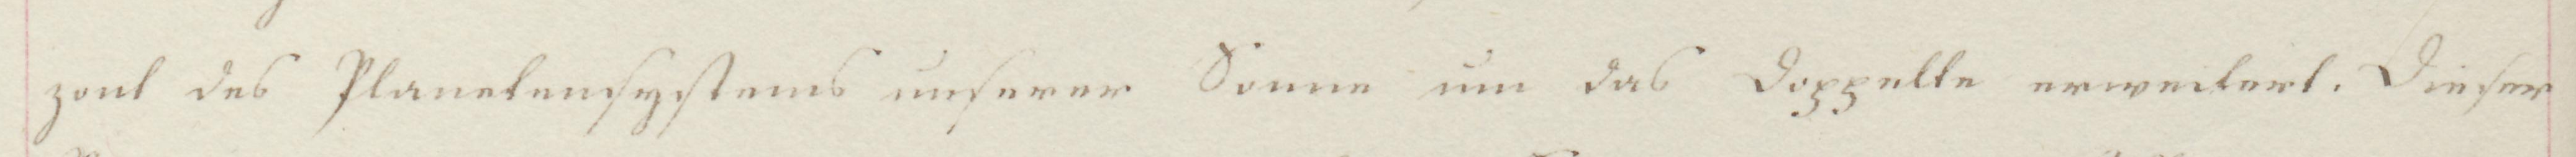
zont des Planetensystems unserer Sonne um das Doppelte erweitert. Dieser
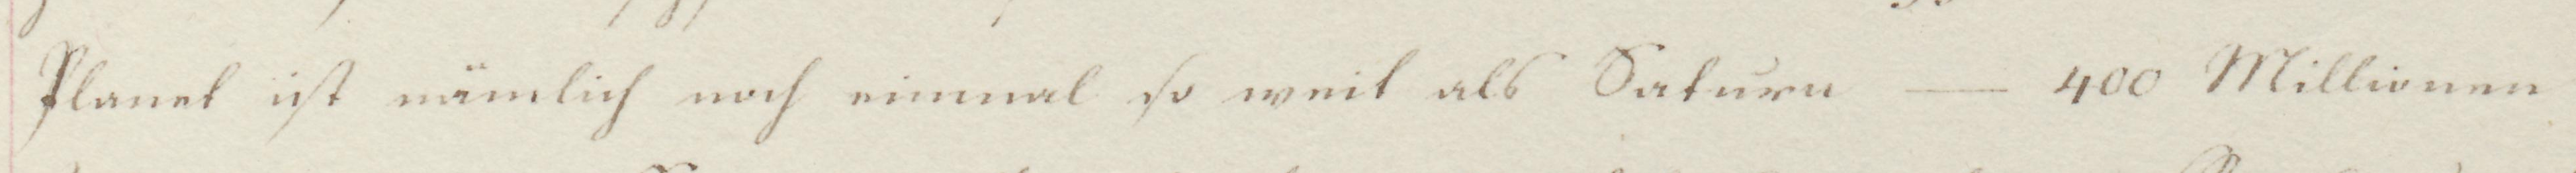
Planet ist nämlich noch einmal so weit als Saturn – 400 Millionen
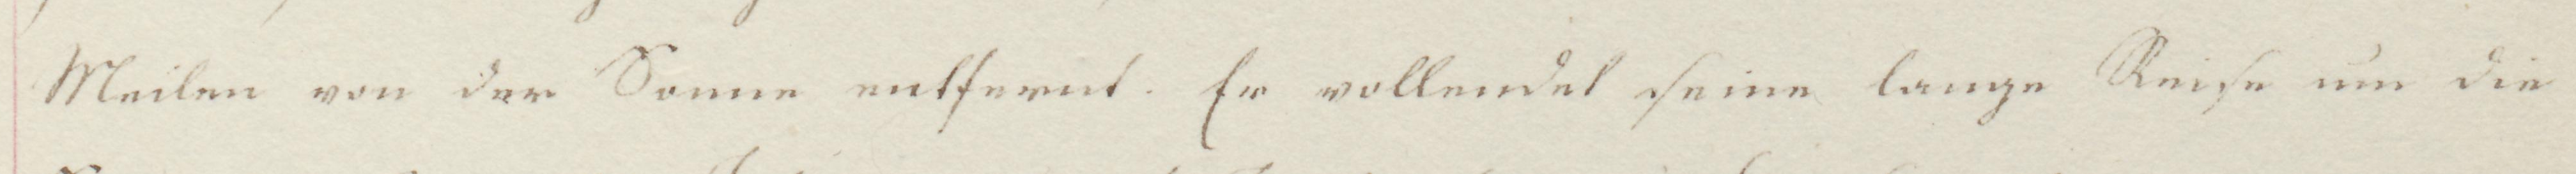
Meilen von der Sonne entfernt. Er vollendet seine lange Reise um die
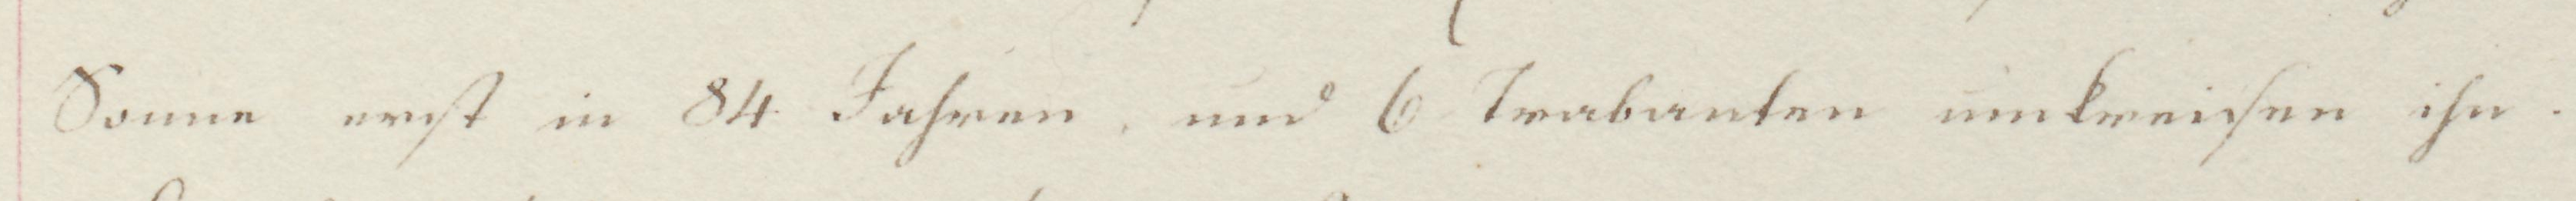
Sonne erst in 84 Jahren, und 6 Trabanten umkreisen ihn.
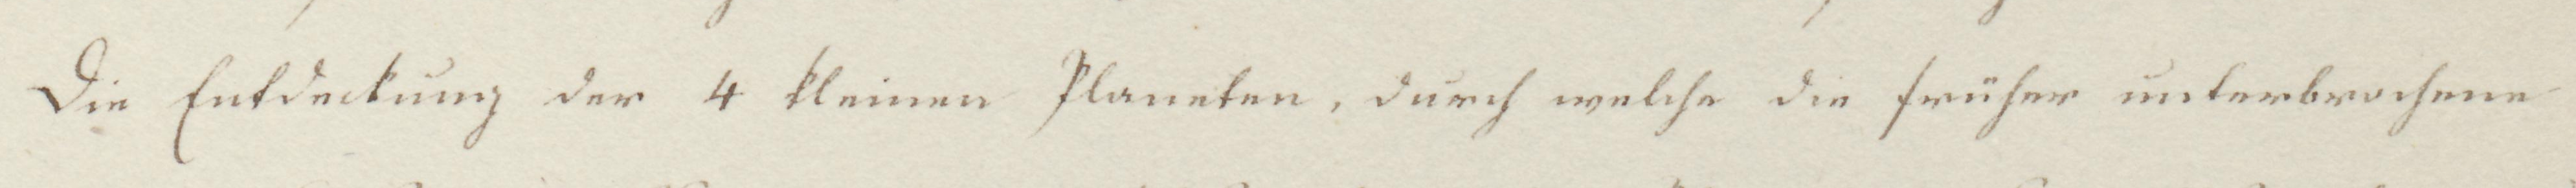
Die Entdeckung der 4 kleinen Planeten, durch welche die früher unterbrochene
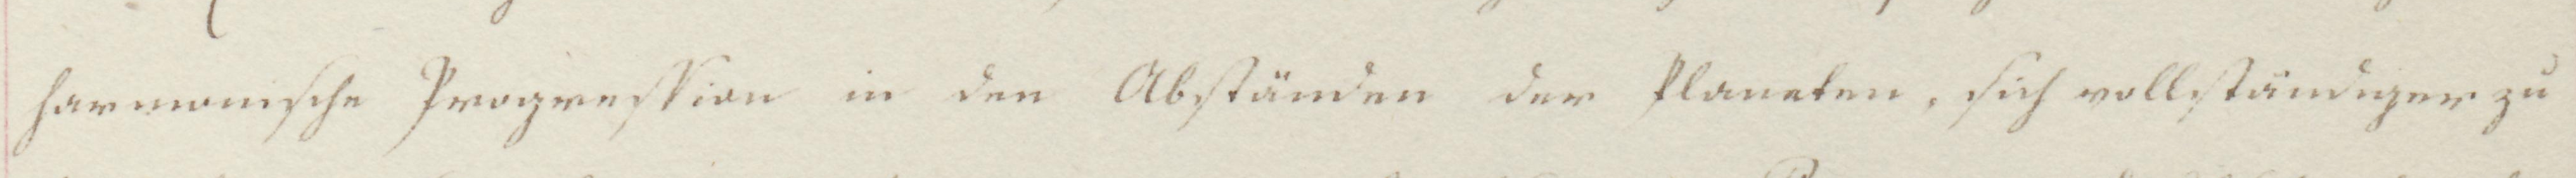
harmonische Progression in den Abständen der Planeten, sich vollständiger zu
